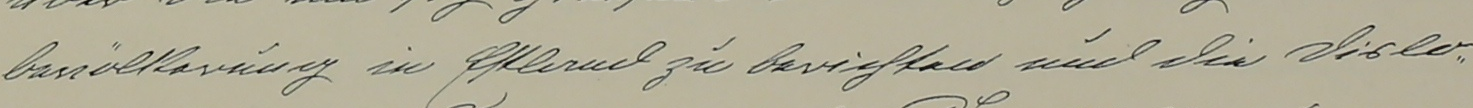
bevölkerung in Estland zu berichten und die Dislo-
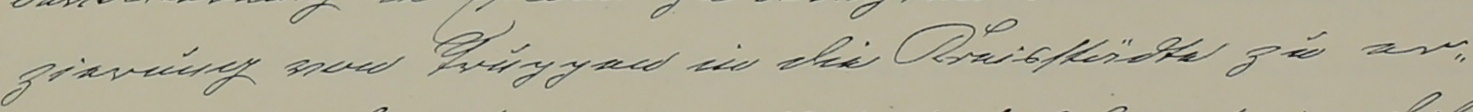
zierung von Truppen in die Kreisstädte zu er-
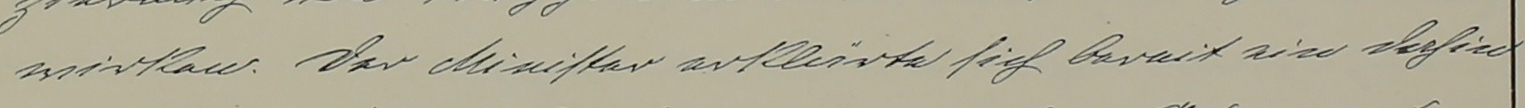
wirken. Der Minister erklärte sich bereit ein dahin
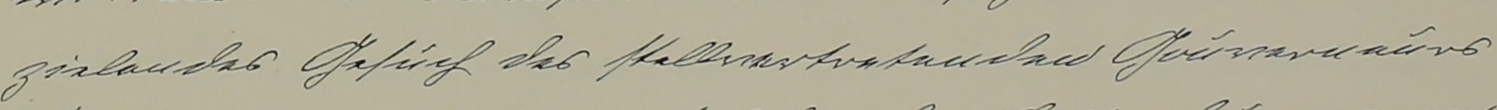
zielendes Gesuch des stellvertretenden Gouverneurs
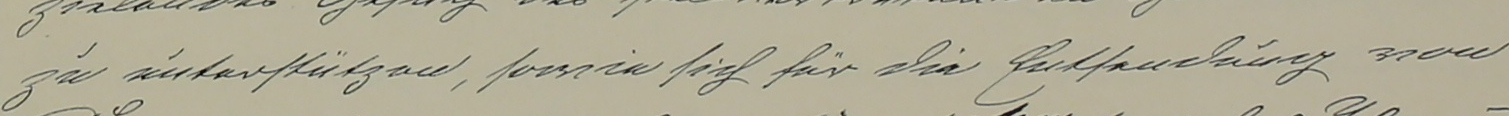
zu unterstützen, sowie sich für die Entsendung von
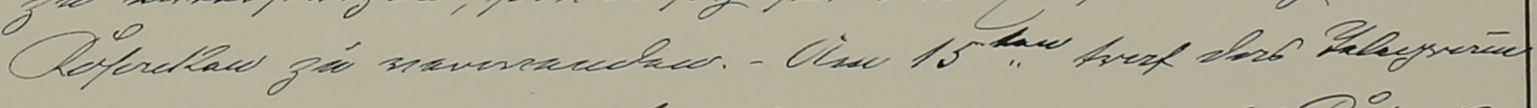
Kosacken zu verwenden. - Am 15ten traf das Telegramm
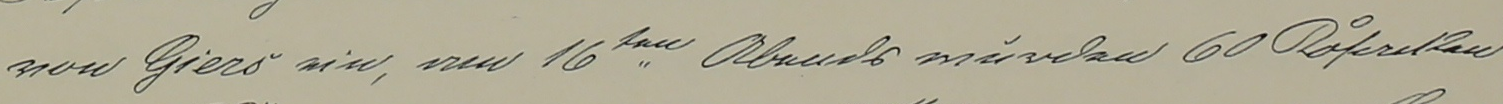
von Giers ein, am 16ten abends wurden 60 Kosacken
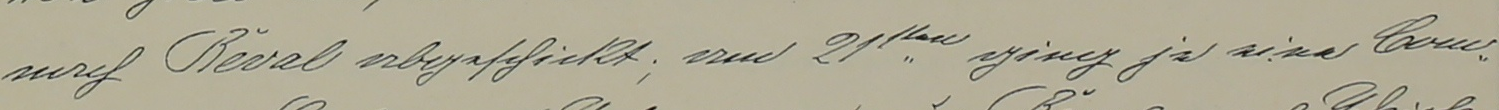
nach Reval abgeschickt; am 21ten ging je eine Com-
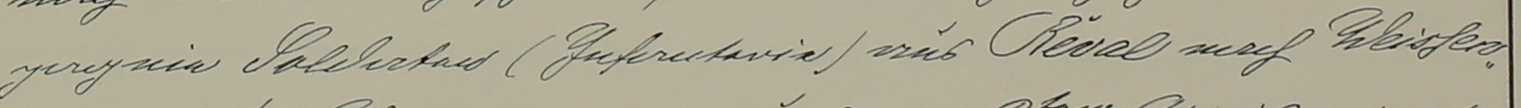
pagnie Soldaten (Infanterie) aus Reval nach Weissen-
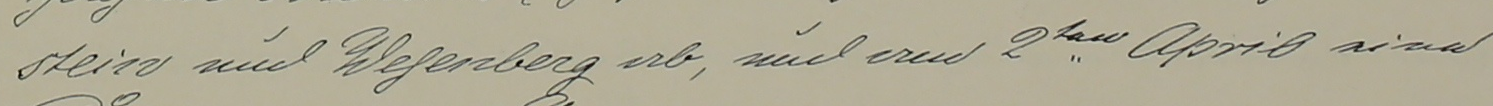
stein und Wesenberg ab, und am 2ten April eine
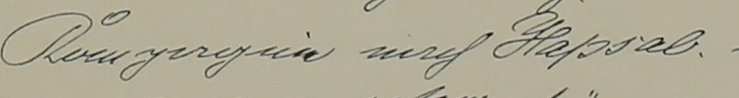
Kompagnie nach Hapsal.
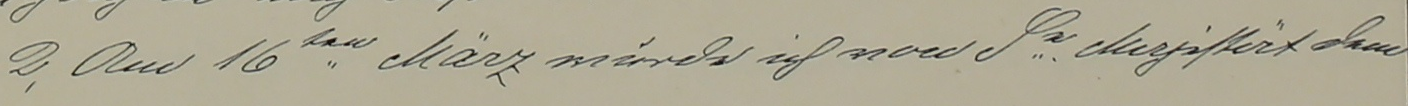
2. Am 16ten März wurde ich von Se. Majestät dem
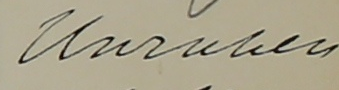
Unruhen
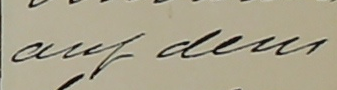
auf dem
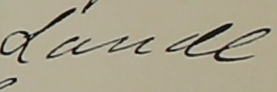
Lande
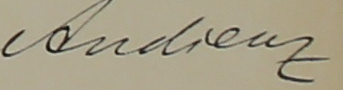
Audienz
